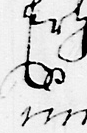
d.
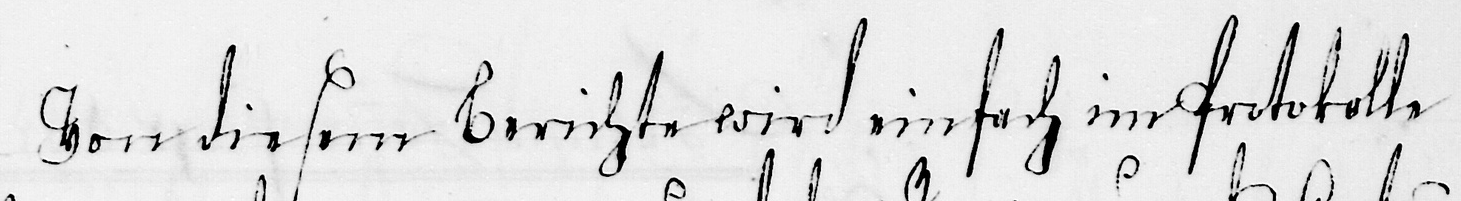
Von diesem Berichte wird einfach im Protokolle
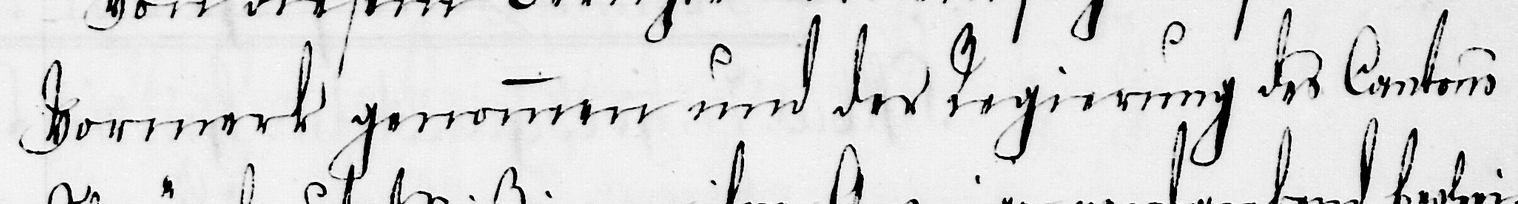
Vormerk genommen und der Regierung des Cantons
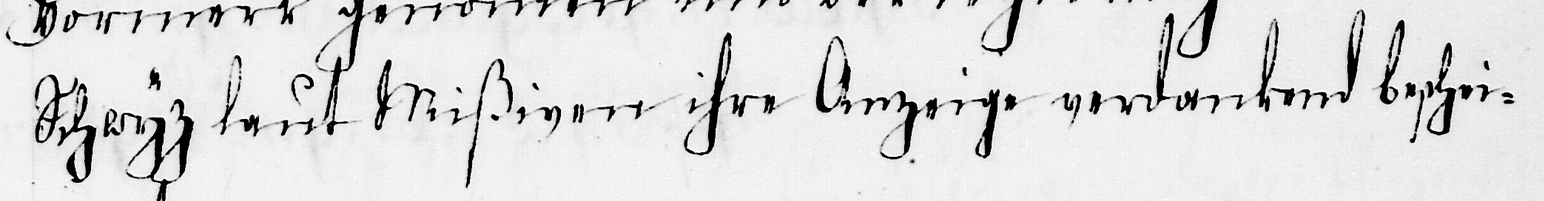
Schwyz laut Mißiven ihre Anzeige verdankend beschei¬
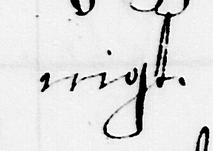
nigt.
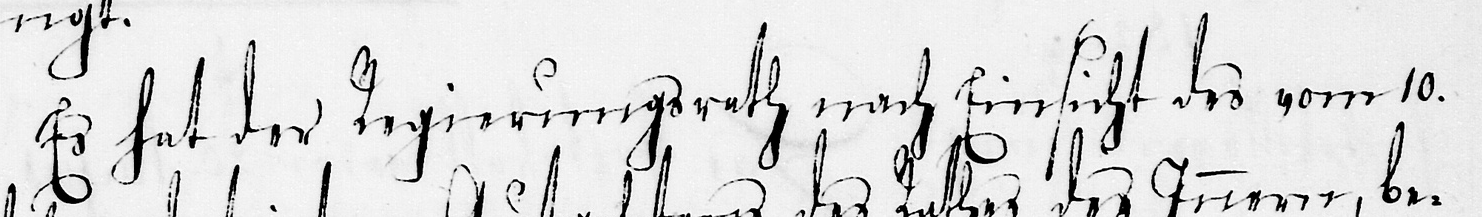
Es hat der Regierungsrath nach Einsicht des vom 10.
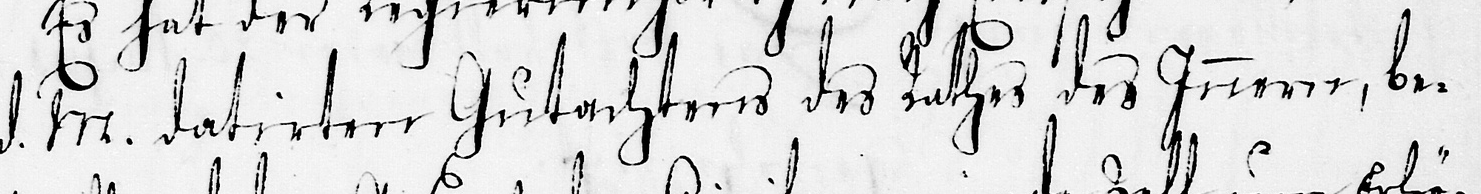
M. datirten Gutachtens des Rathes des Innern, be¬
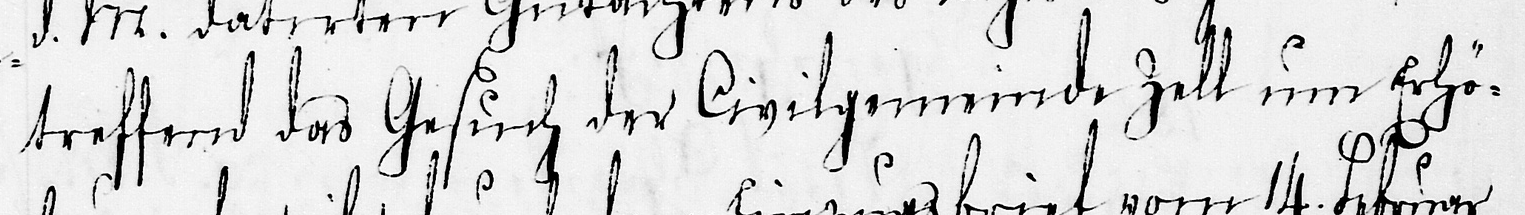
treffend das Gesuch der Civilgemeinde Zell um Erhö¬
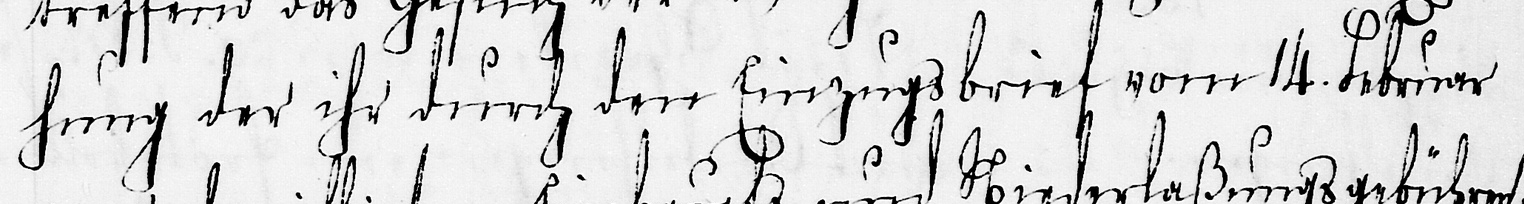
hung der ihr durch den Einzugsbrief vom 14. Februar
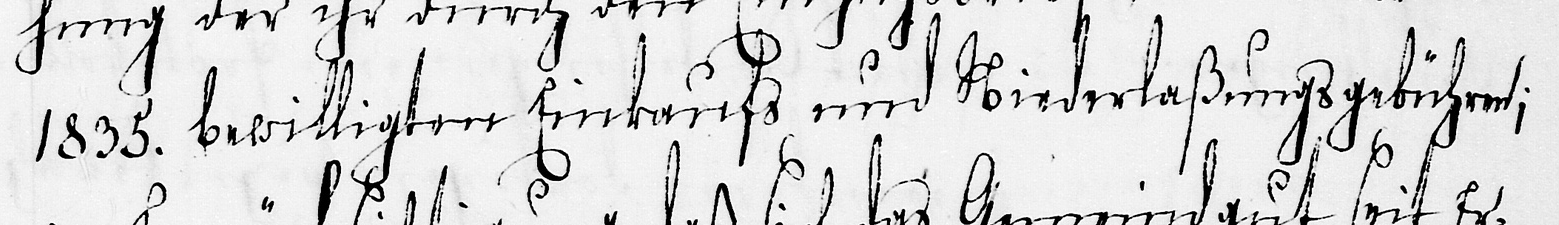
1835. bewilligten Einkaufs und Niederlaßungsgebühren;
